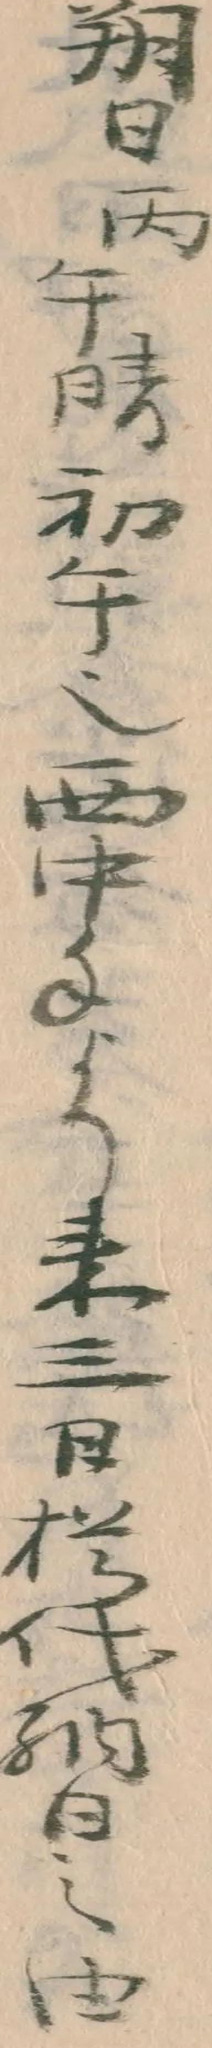朔日丙午晴初午也西中手より来三日樽代納日之由
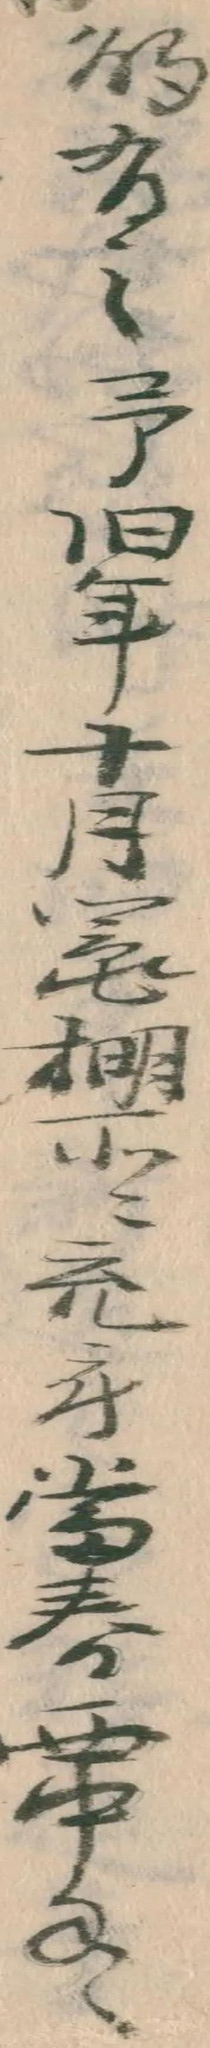触有之予旧年十月籤棚所ニ充ニ付當春西中手へ
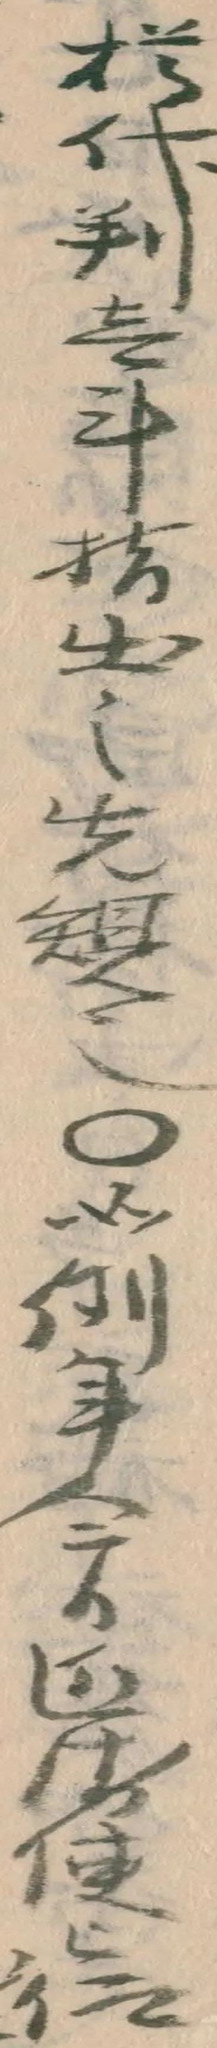樽代判壱斗指出之先規也○如例年今日近衛使被仰出云々
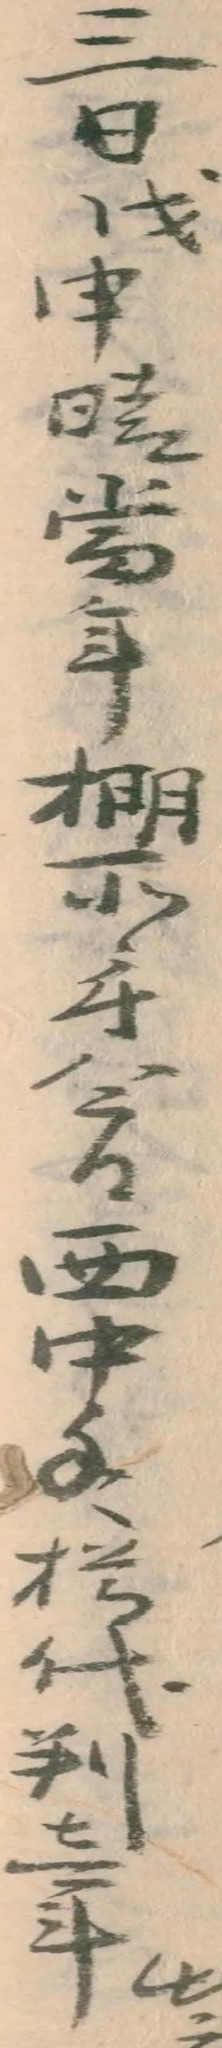三日戊申晴當年棚所ニ付今日西中手へ樽代判壱斗
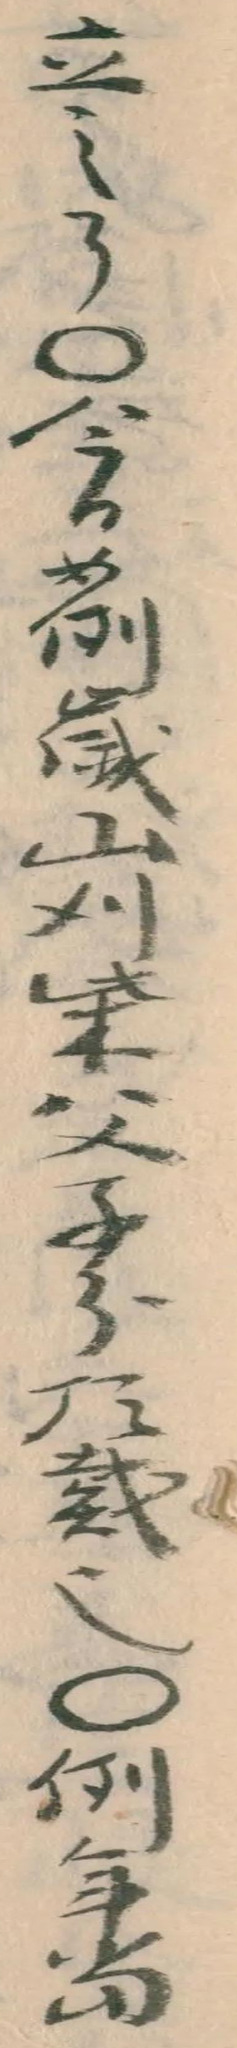立之了○今日如例歳山刈柴父子分頂戴也○例年當
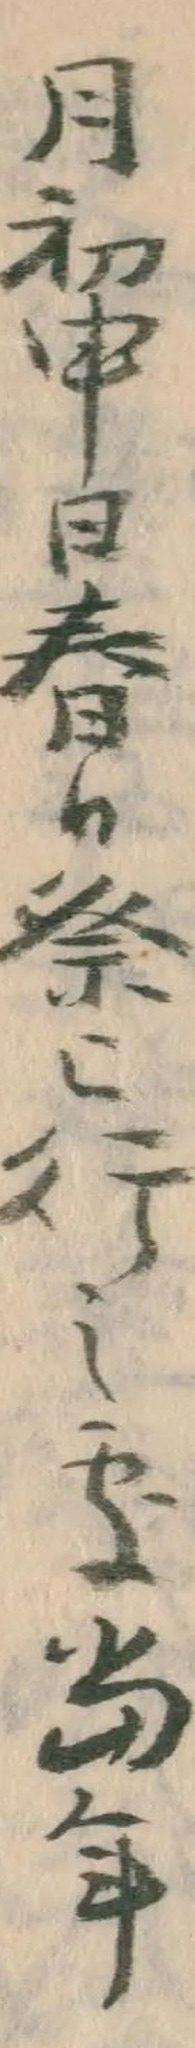月初申日春日祭被行之處當年
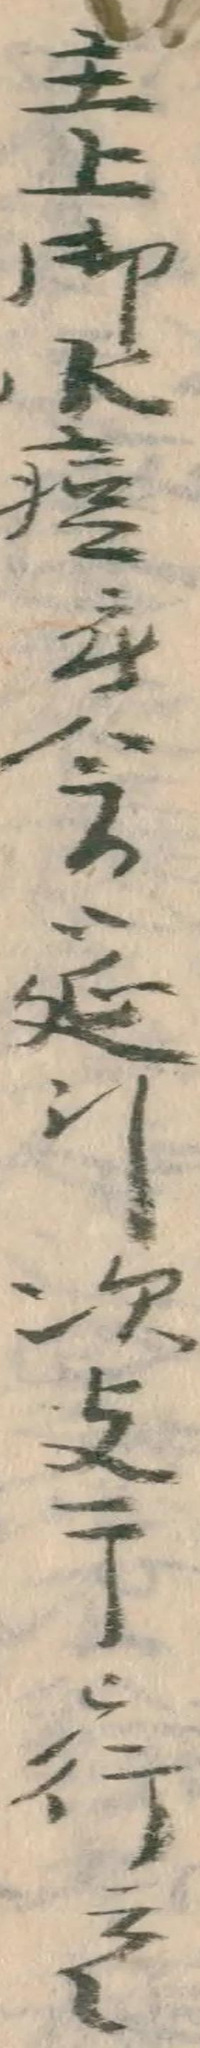主上御水痘ニ付今日ハ延引次支干被行云々
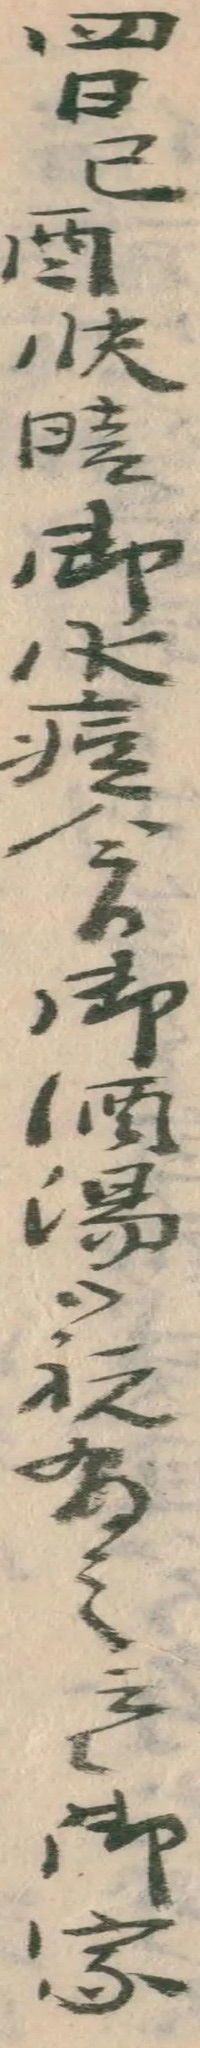四日己酉快晴御水痘今日御酒湯御祝有之云々御家
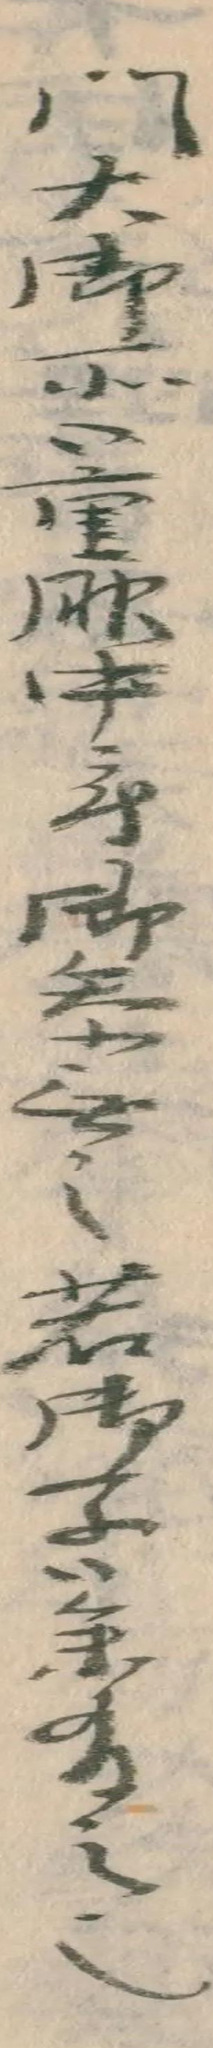門大御所御重服中ニ付御参無之若御子御参有之也
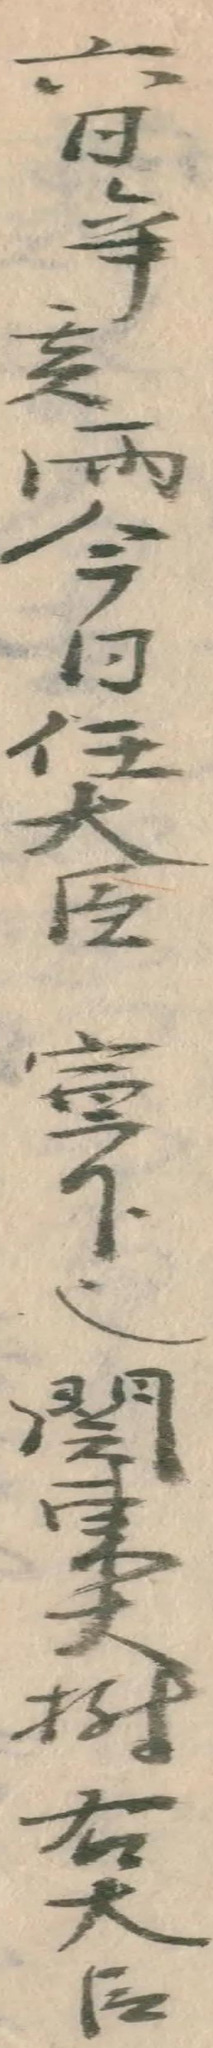六日辛亥雨今日任大臣宣下也関東大樹右大臣
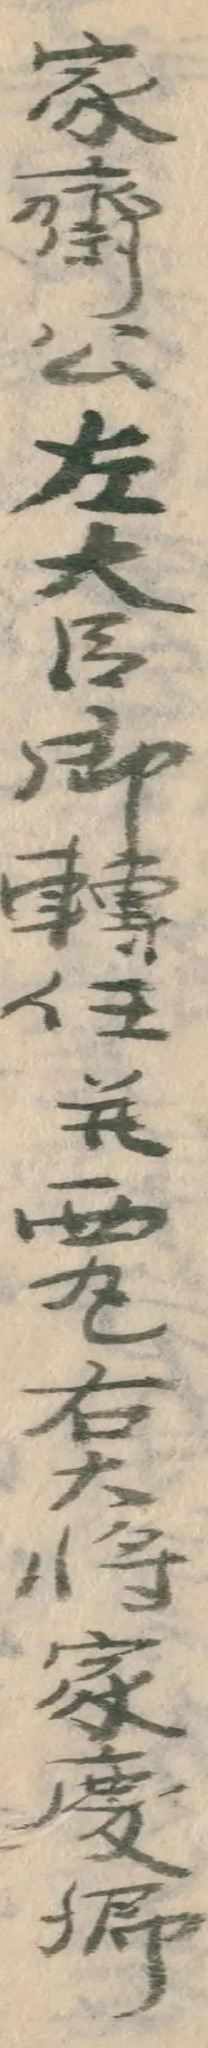家齋公左大臣御轉任并西丸右大将家慶卿
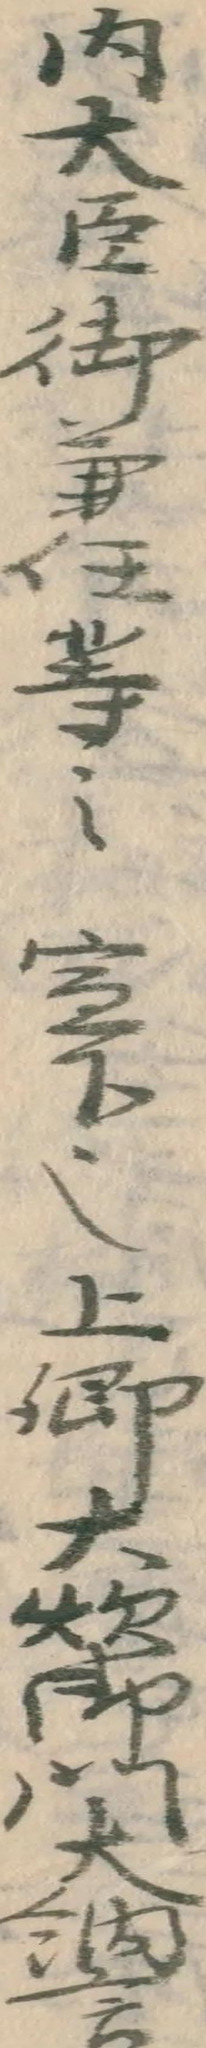内大臣御兼任等之宣下也上卿大炊御門大納言
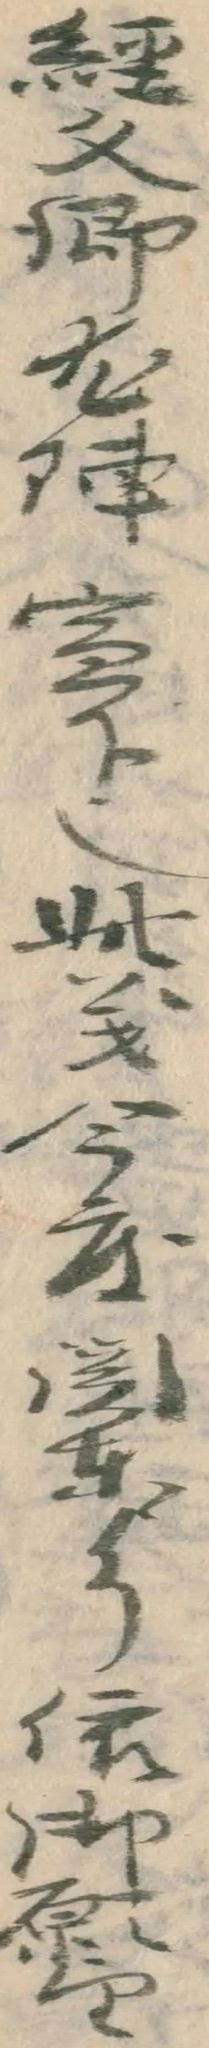経久卿尤陣宣下也此義今度関東より依御願望
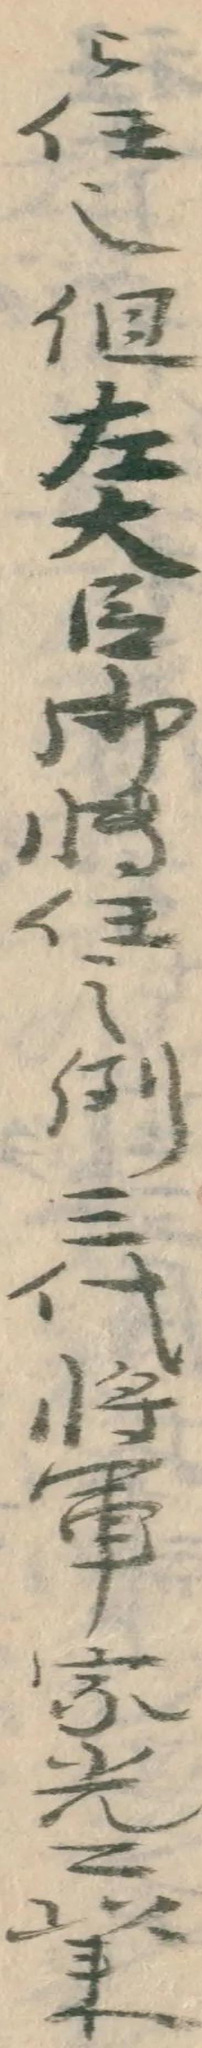被任也但左大臣御轉任之例三代将軍家光公以来
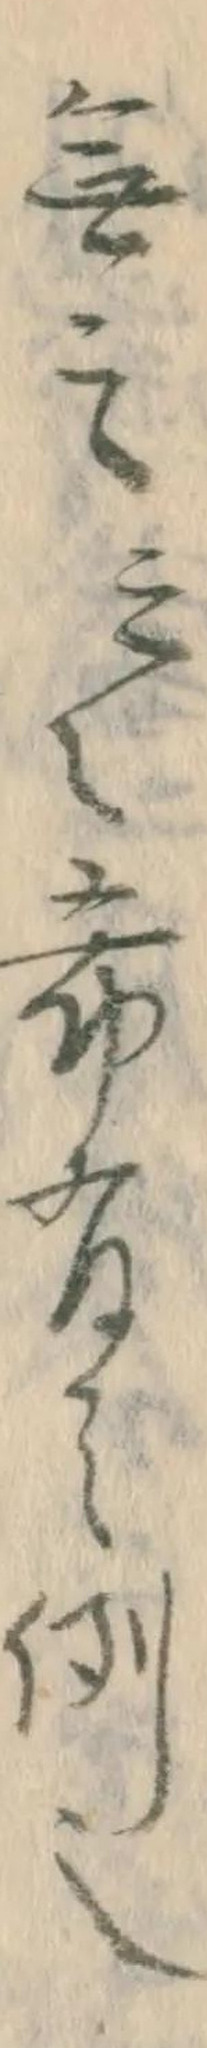無之云々希有之例也
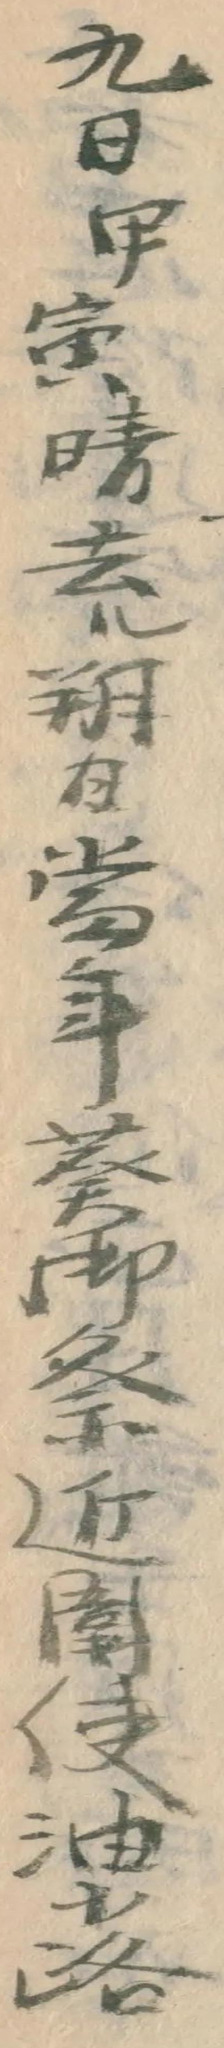九日甲寅晴去ル朔日當年葵御祭近衛使油小路
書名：賀茂社記録. 第63冊
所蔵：国立国会図書館 National Diet Library, JAPAN
